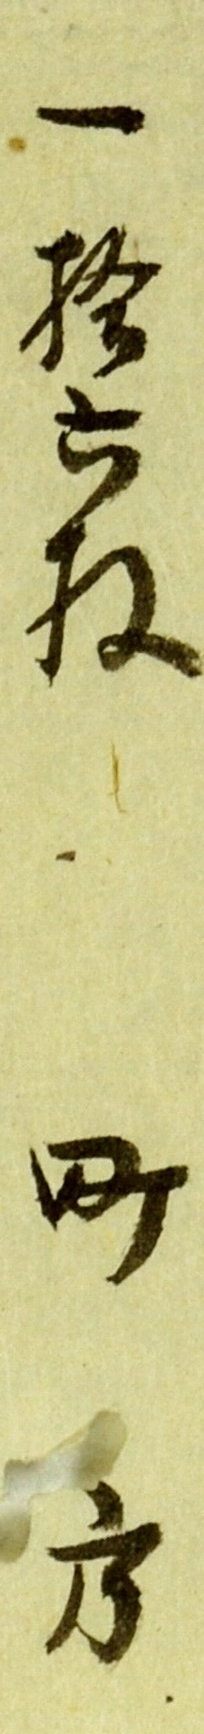一拾六枚町方
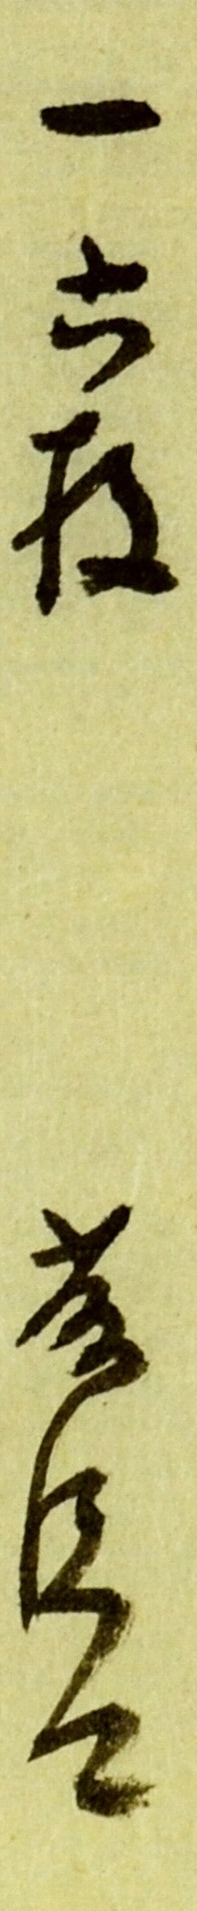一六枚藤沢郷
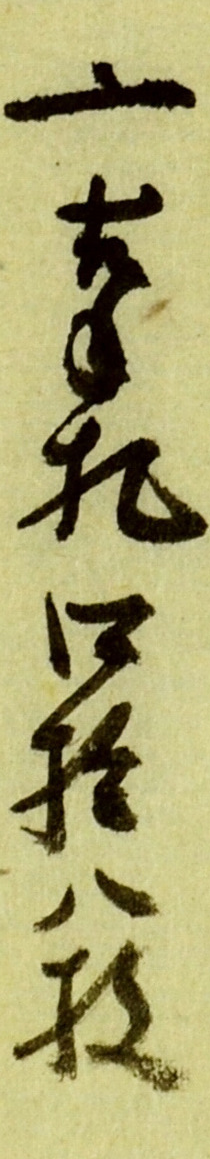〆古手札四拾八枚
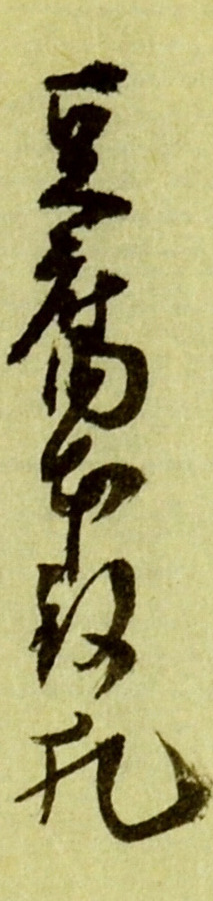豆腐本役札
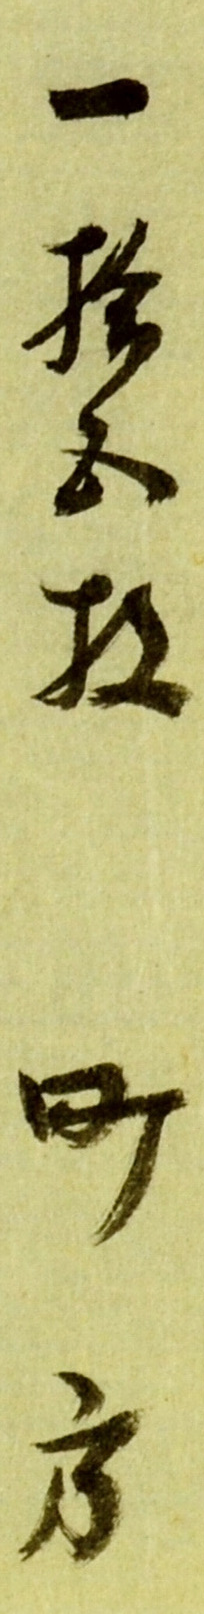一拾五枚町方
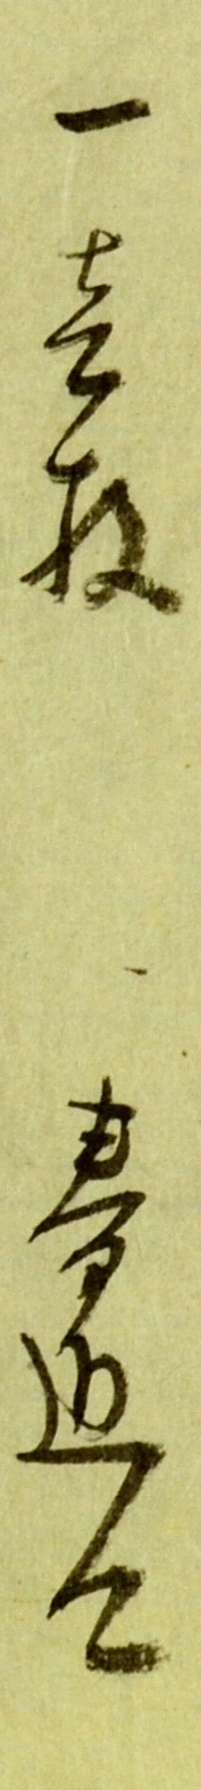一壱枚春近郷

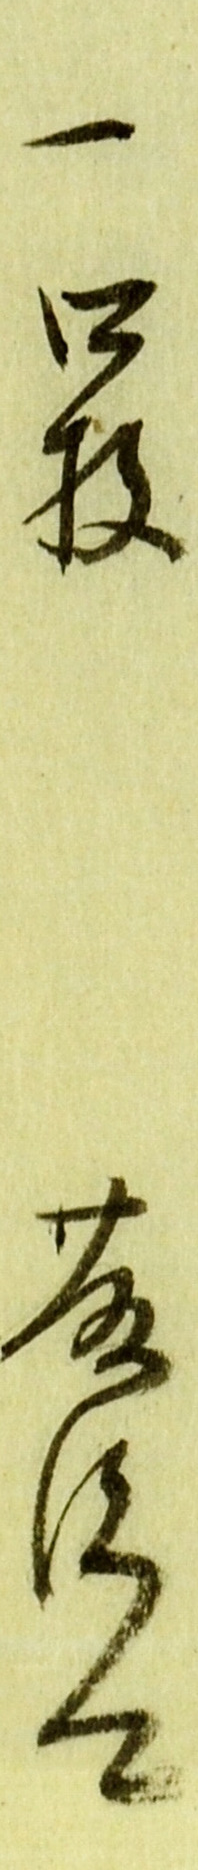一四枚藤沢郷
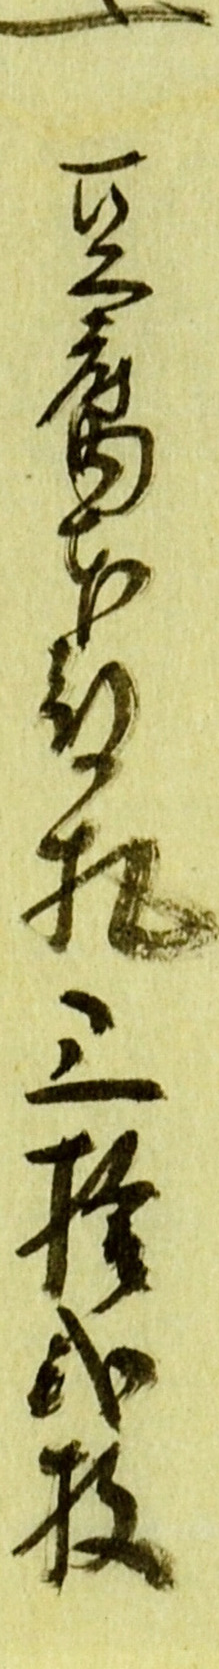〆豆腐本役札三拾弐枚
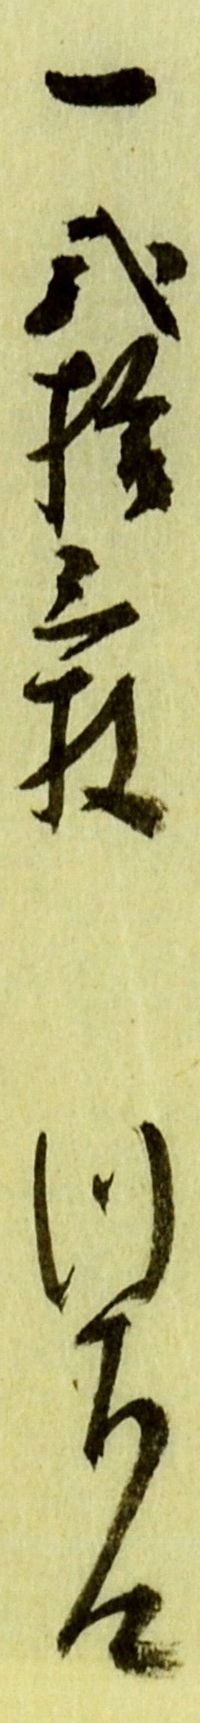一弐拾三枚川下郷
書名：午年諸郷并町方鑑札渡覚
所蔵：伊那市立高遠町図書館・合同会社AMANE
